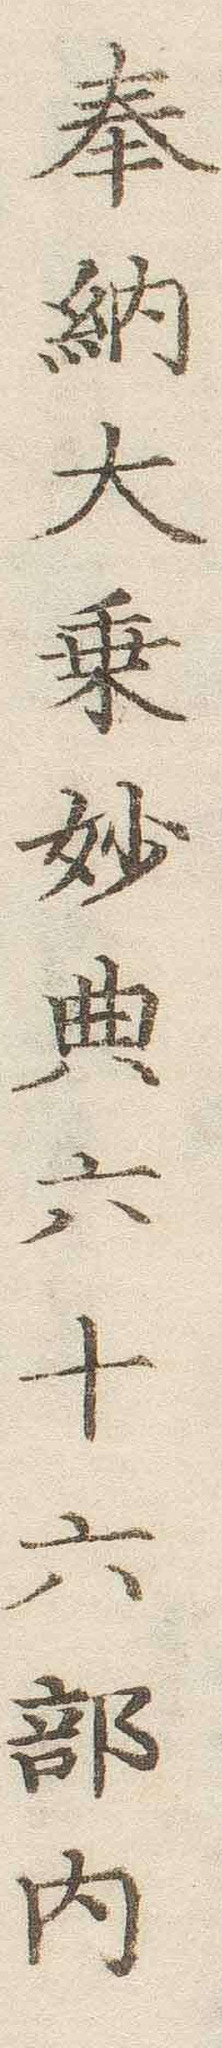奉納大乗妙典六十六部内
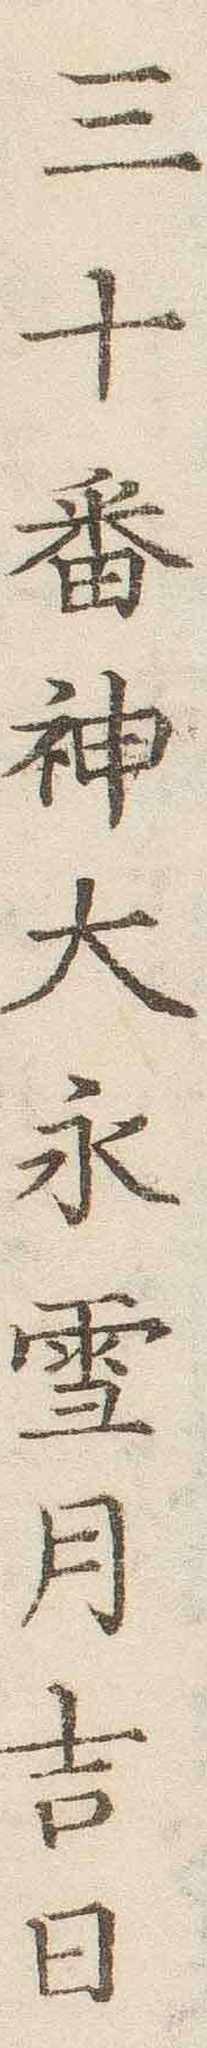三十番神大永雪月吉日
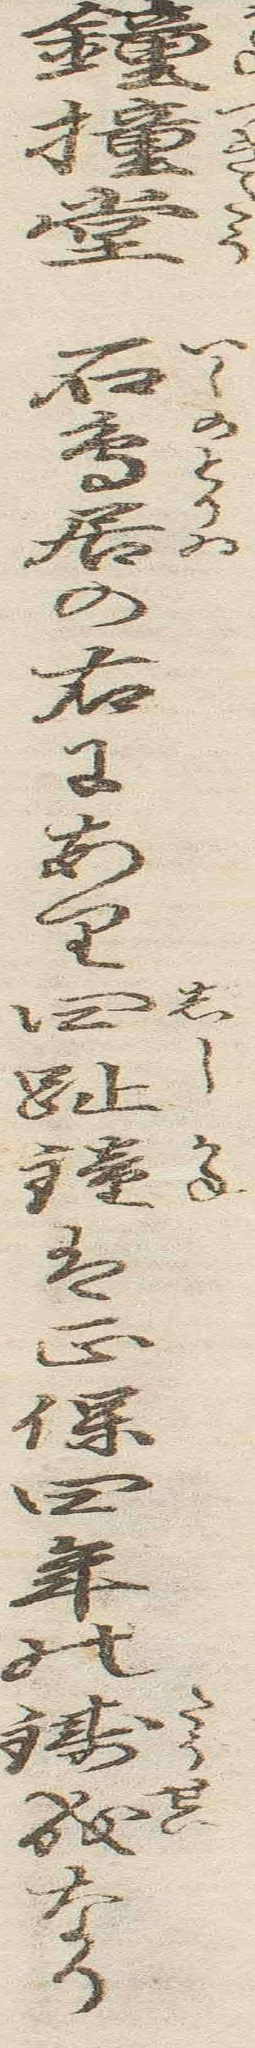鐘撞堂石鳥居の右にあり四趾鐘は正保四年の鋳成なり
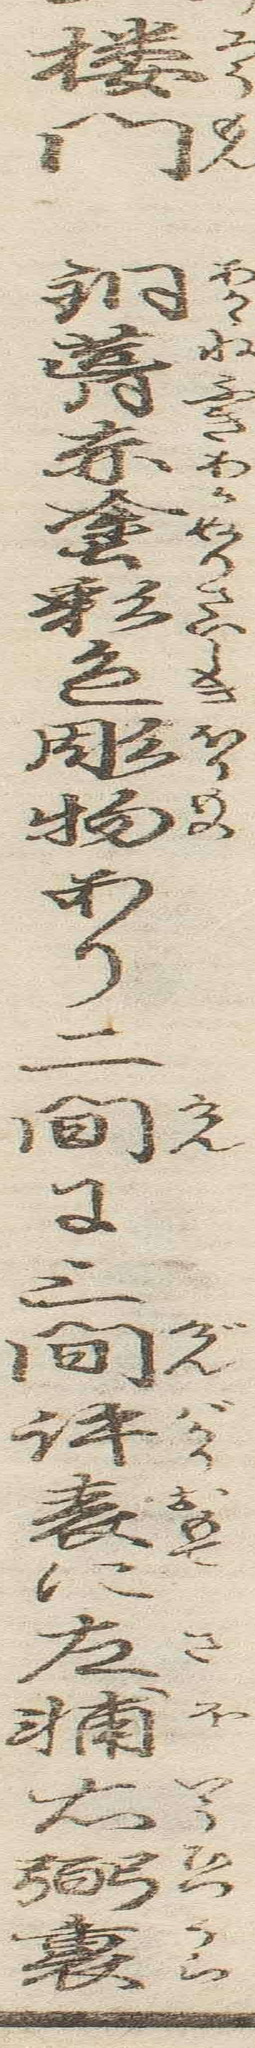二王樓門銅葺赤塗彩色彫物あり二間に三間許表に左輔右弼裏
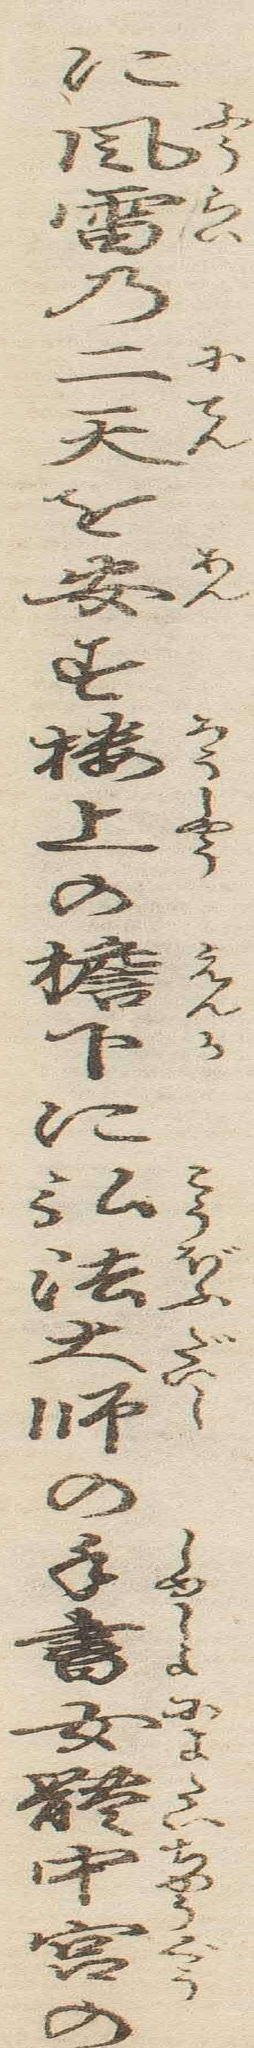に風雷の二天を安す楼上の檐下に弘法大師の手書女體中宮の
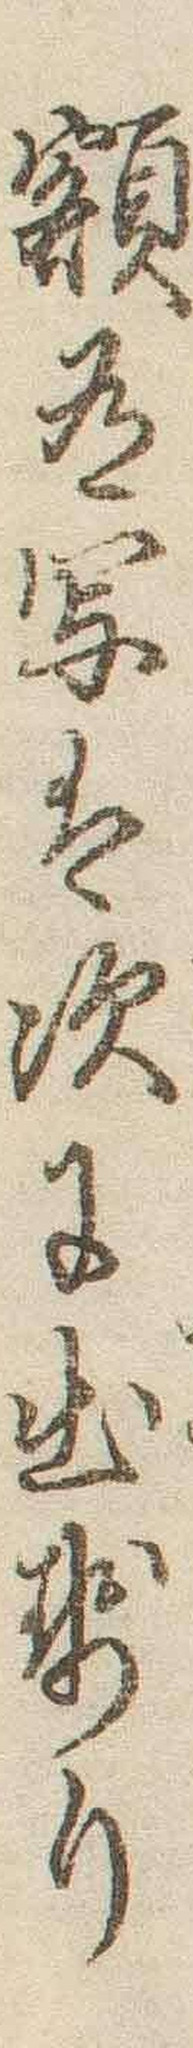額有写は次に出せり

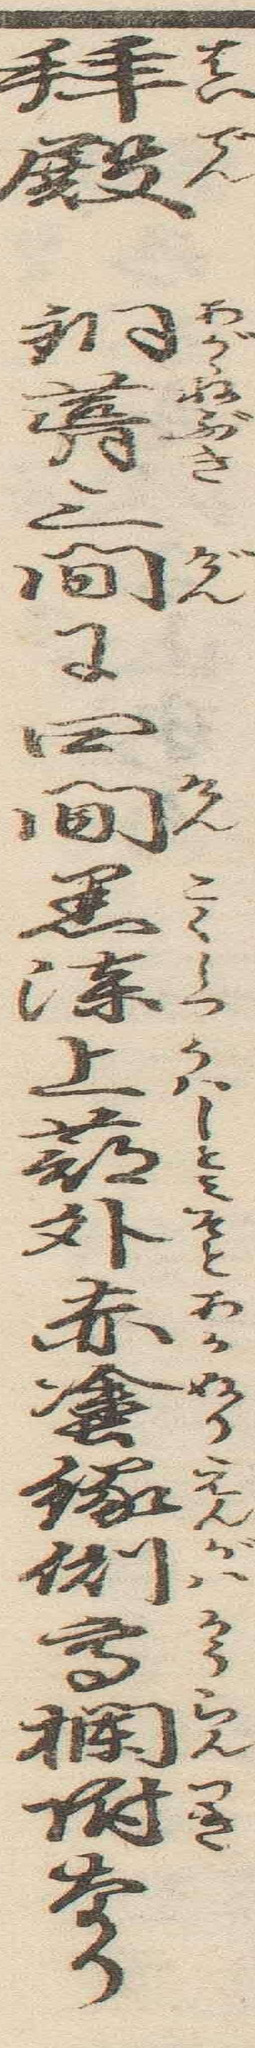拜殿銅葺三間に四間黒漆上蔀外赤塗縁側高欄附なり
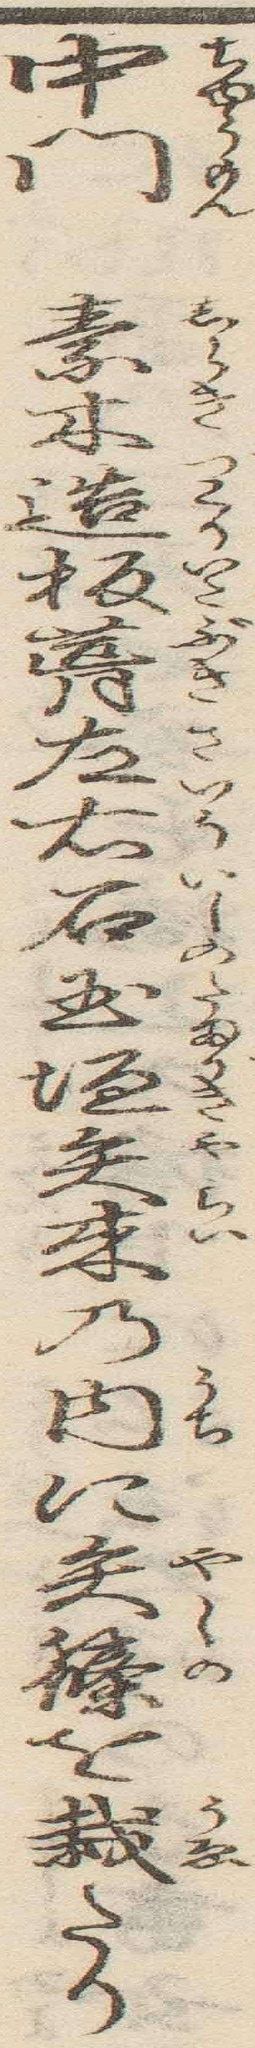中門素木造板葺左右石玉垣矢來の内に矢篠を栽たり
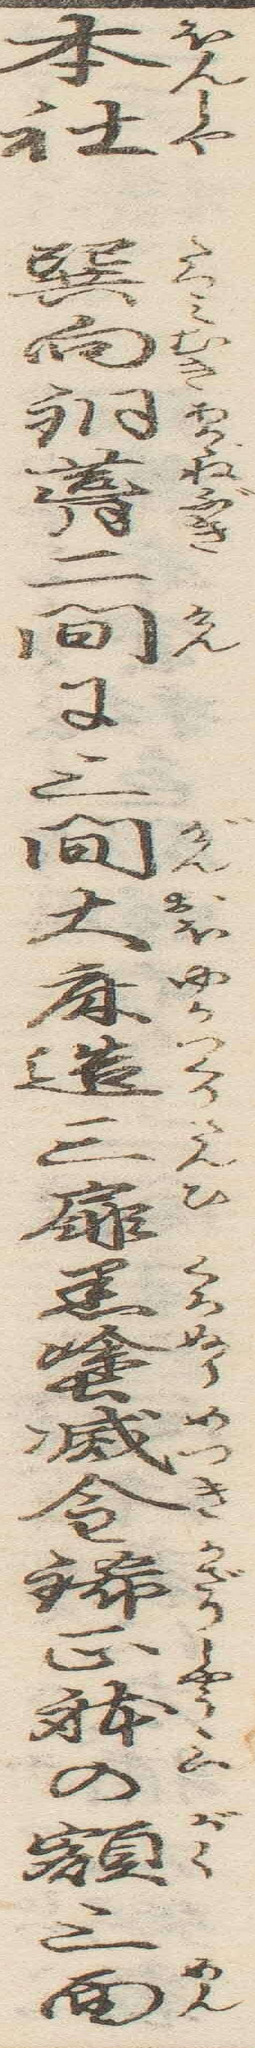本社巽向銅葺二間に三間大床造三扉黒塗滅金䤭正躰の額三面
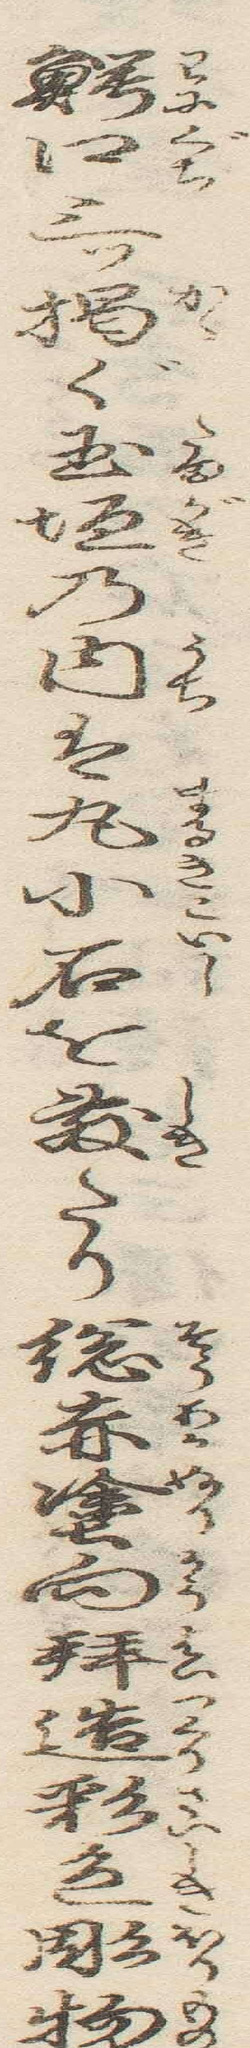鰐口三ッ掲ぐ玉垣の内は丸小石を敷たり総赤塗向拜造彩色彫物
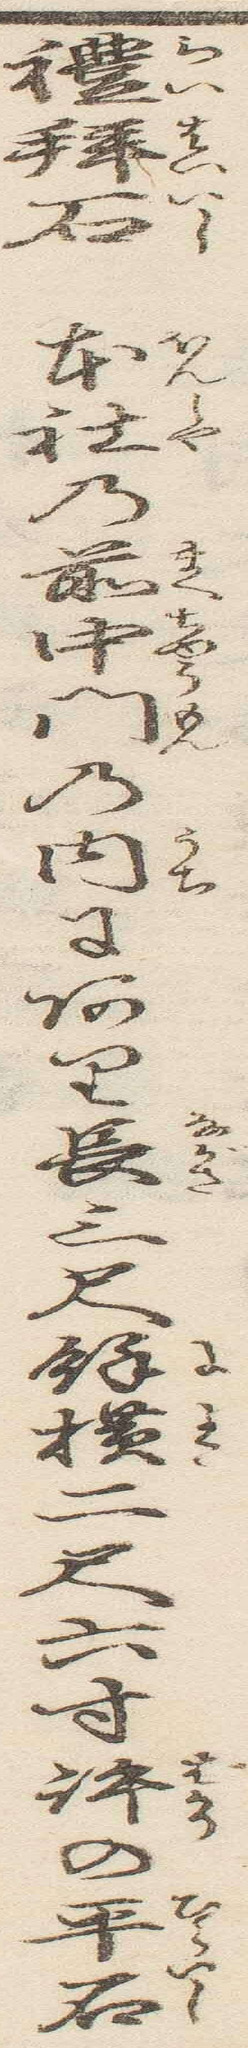禮拜本社の前中門の内にあり長三尺餘横二尺六寸許の平石
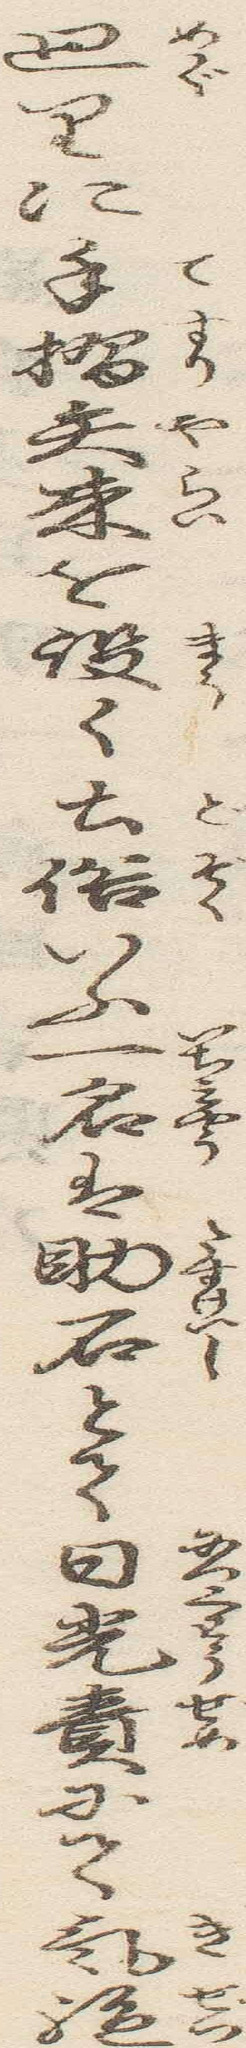廻りに手摺矢來を設く土俗いふ一名は助石とて日光責にて気絶
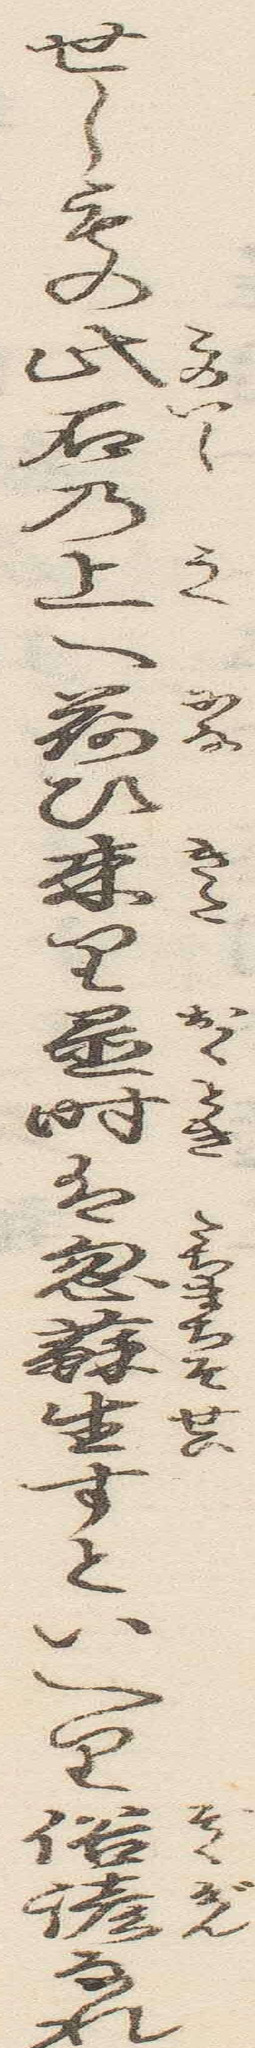せしもの此石の上へ荷ひ來り置时は忽蘇生すといへり俗諺なれ
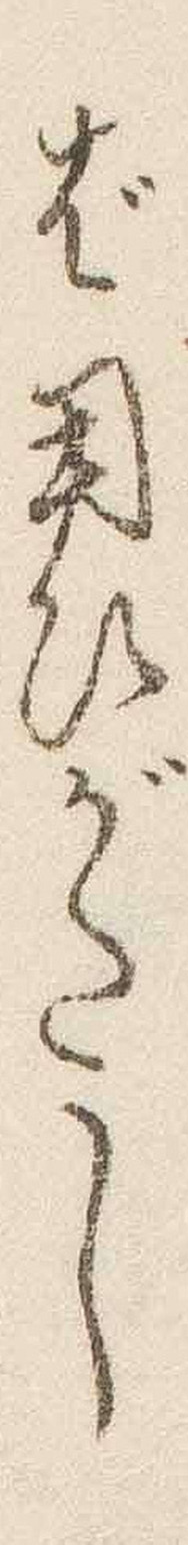ば用ひがたし
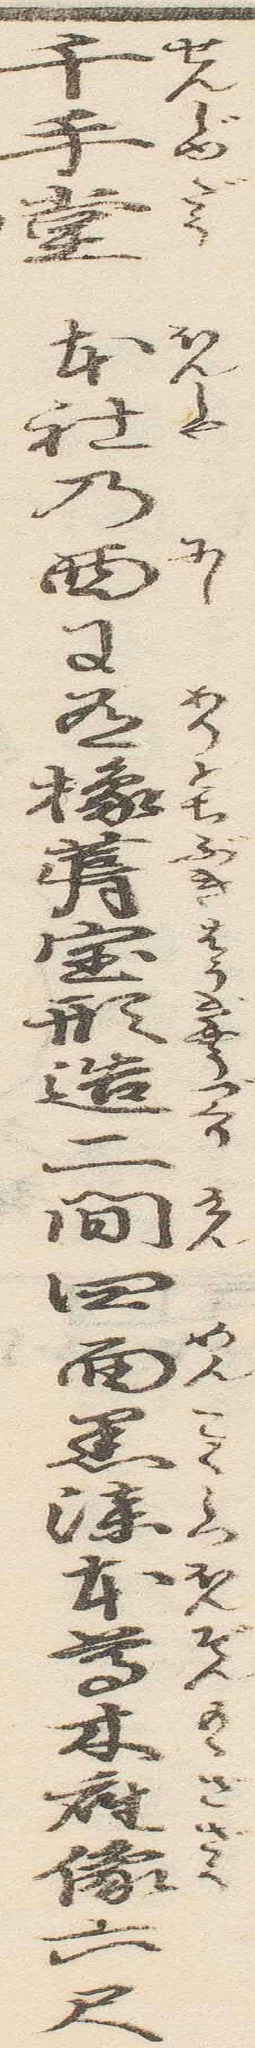千手堂本社の西に有橡葺宝形造二間四面黒漆本尊木座像六尺
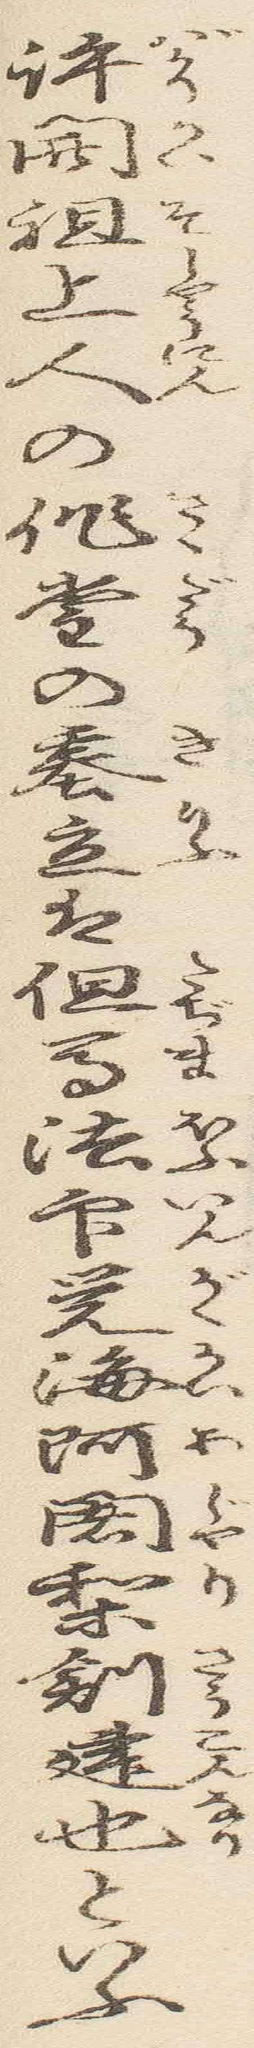許開祖上人の作堂の基立は但馬法印覚海阿闍梨創建也といふ
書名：日光山志
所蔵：東京学芸大学附属図書館 国文学研究資料館
